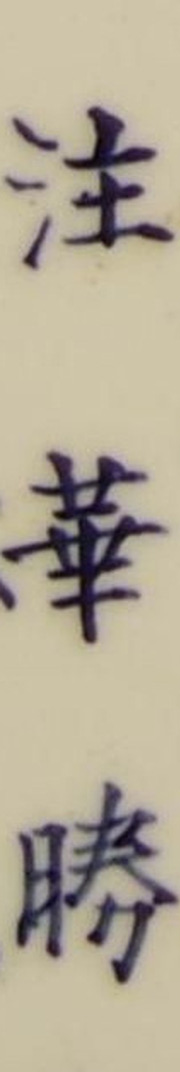注華勝

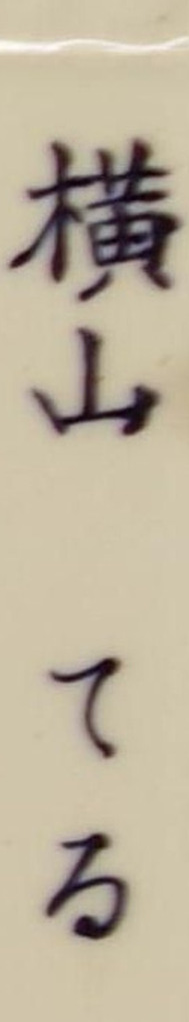横山てる
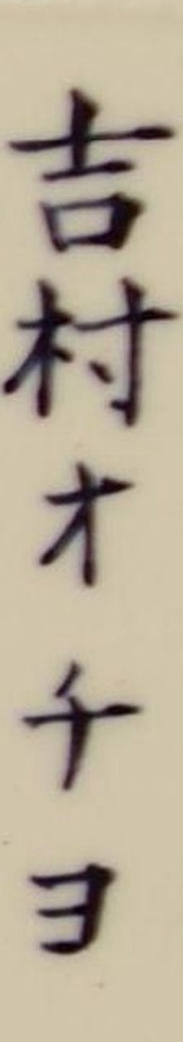吉村オチヨ
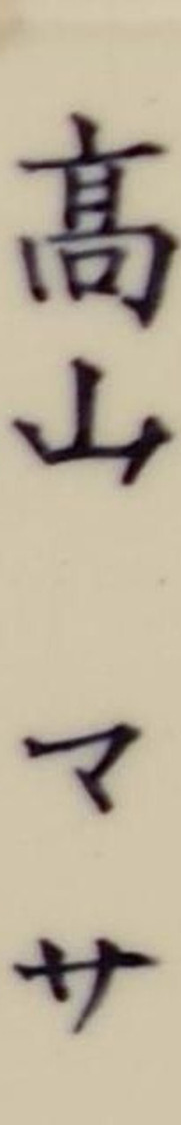高山マサ
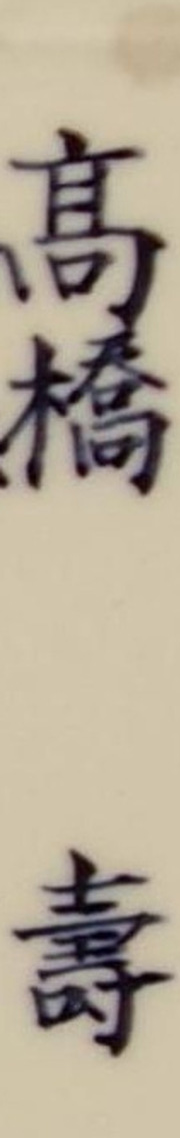高橋壽
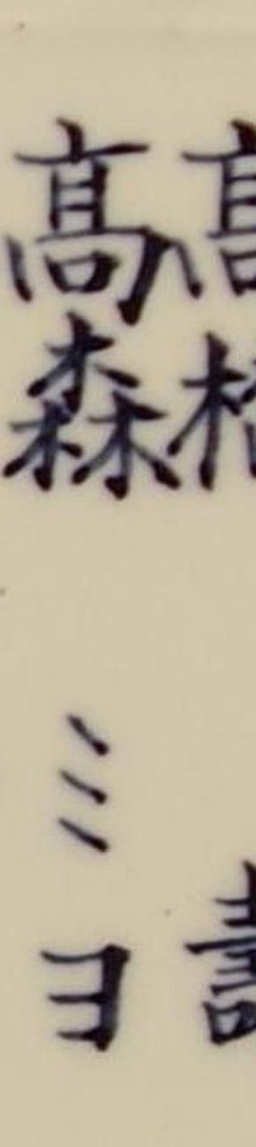高森ミヨ
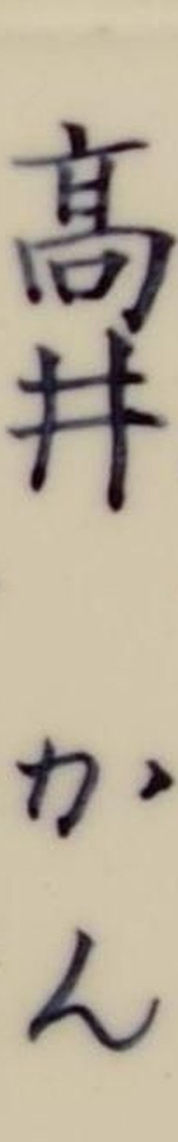高井かん
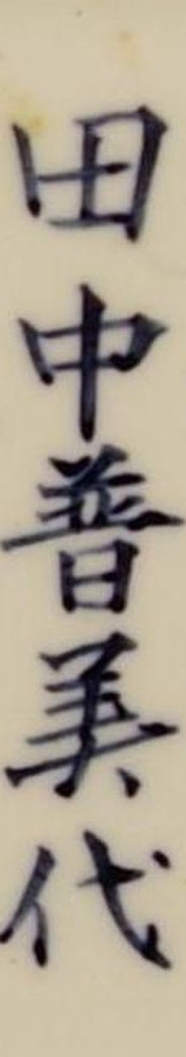田中普美代
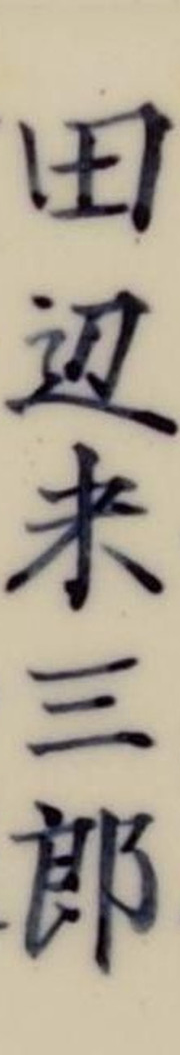田辺米三郎
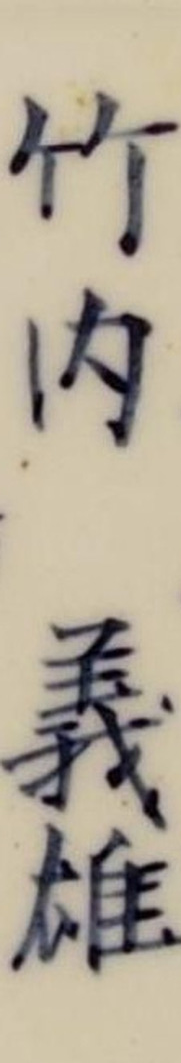竹内義雄
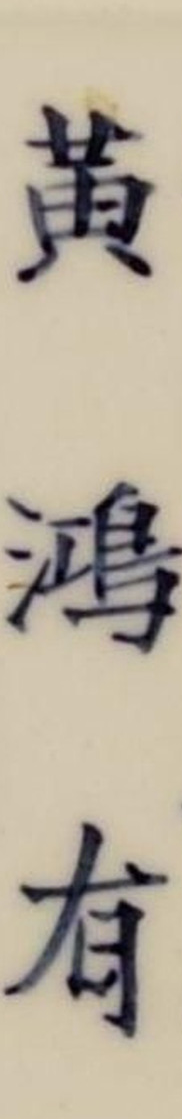黄鴻有
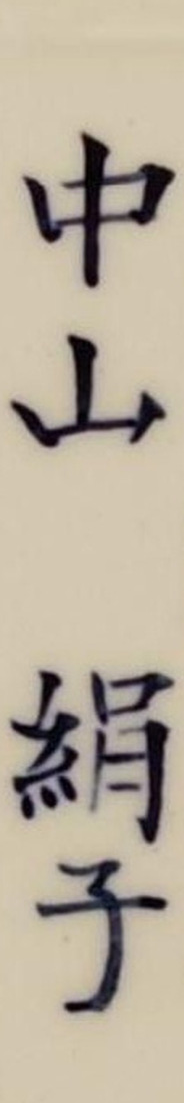中山絹子
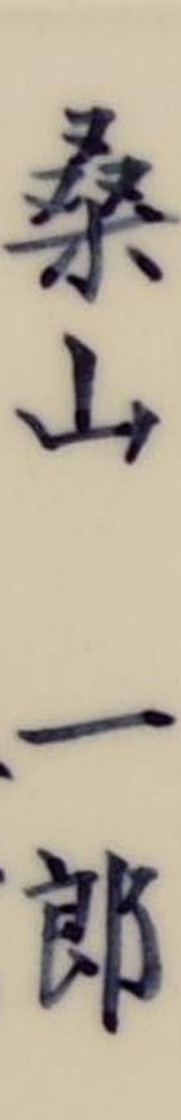桑山一郎
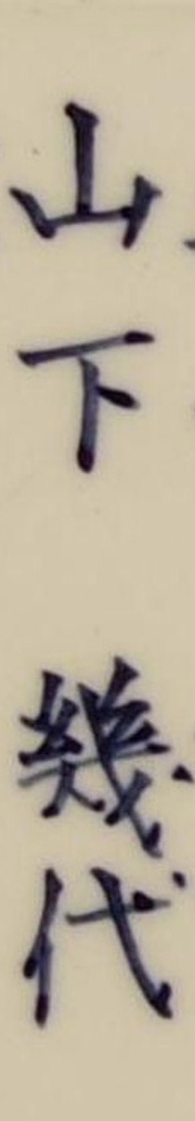山下幾代
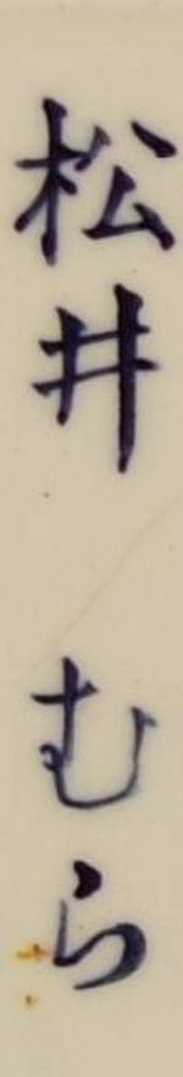松井むら
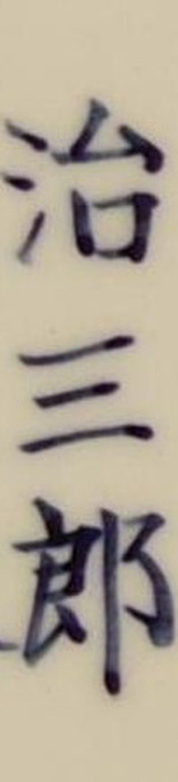治三郎
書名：E~L
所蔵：高野山金剛峯寺
